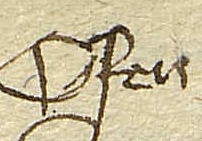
Ofen
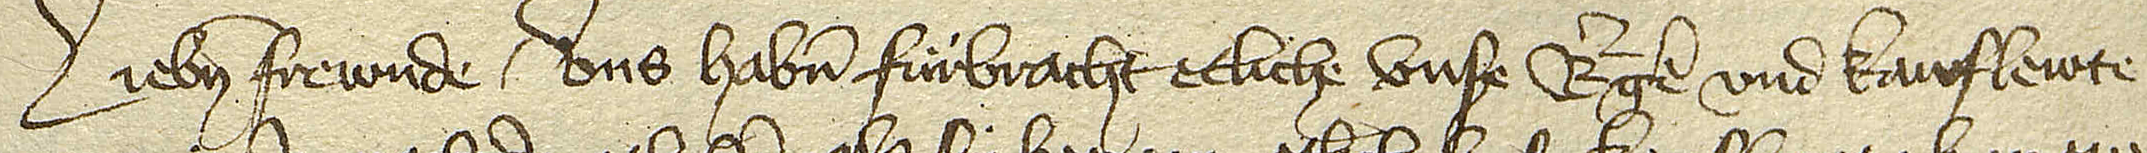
Liebn* frewnde / Vns habn* fürbracht etliche vnſ*e B*ge* vnd kauflewte
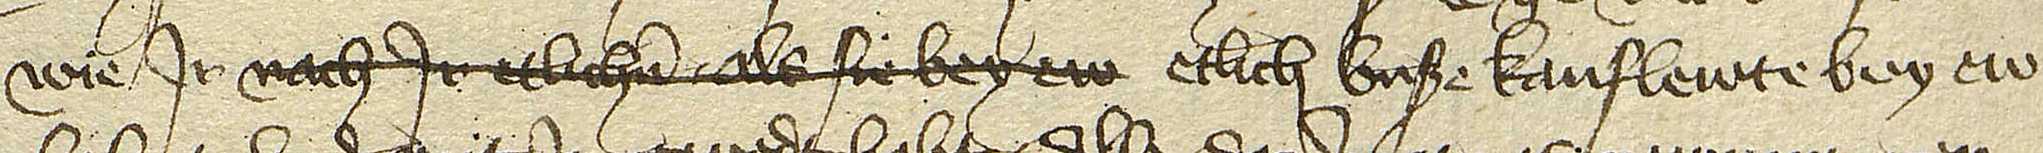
wie Ir nach Ir etlichn* / als ſie bey ew etlich vnſ*e kauflewte bey ew
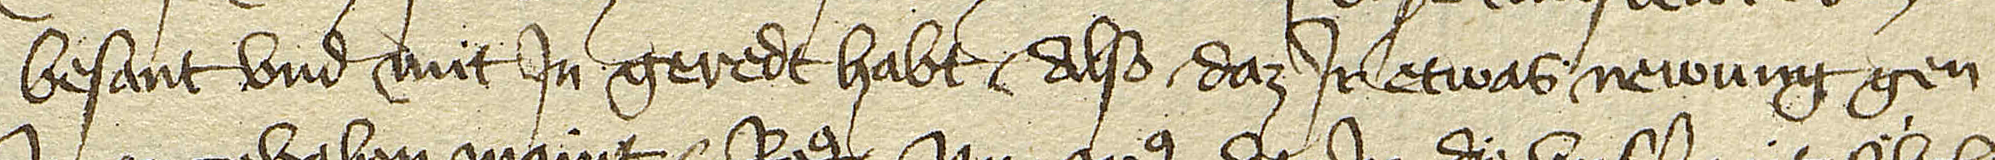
beſant vnd mit In geredt habt / Alſo / daʒ Ir etwas newung gen
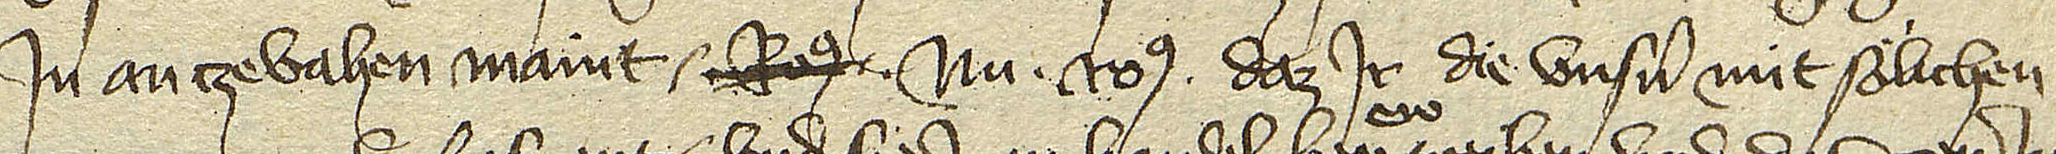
In ancʒevahen maint / Ro* /. Nu. ro*. daʒ Ir die vnſ*n mit ſölichen
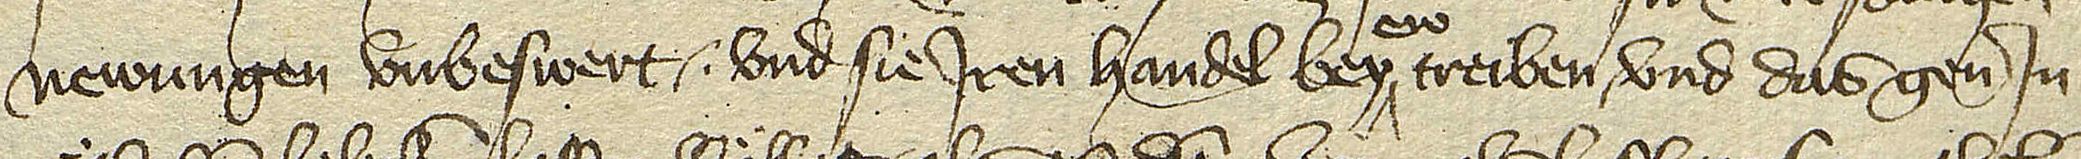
newungen vnbeſwert / . vnd ſie Iren handel bey treiben / vnd das gen In
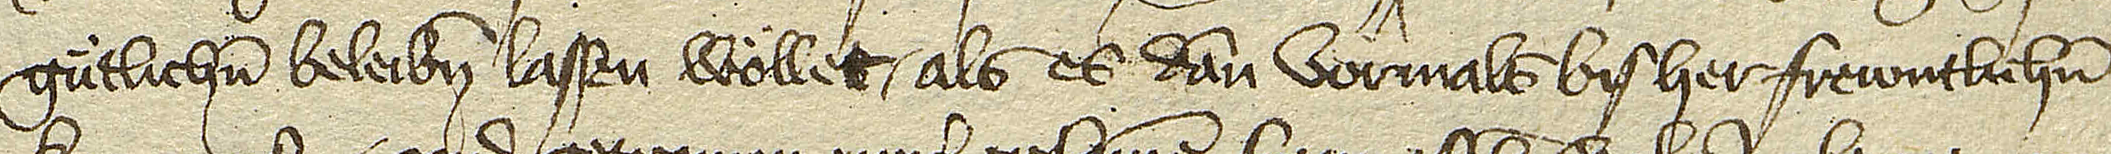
gütlichn* beleibn* laſſen wöllet / als es dan* vormals biſher frewntlichn*
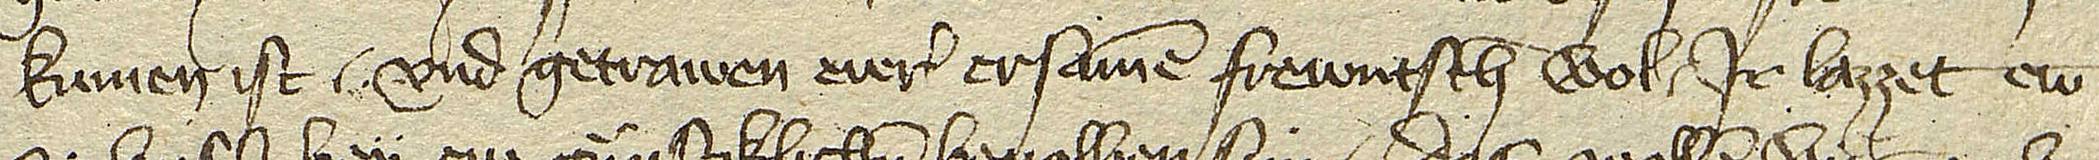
kumen iſt / . vnd getrawen ewr* erſame* frewntſch* wol / Ir laʒʒet ew
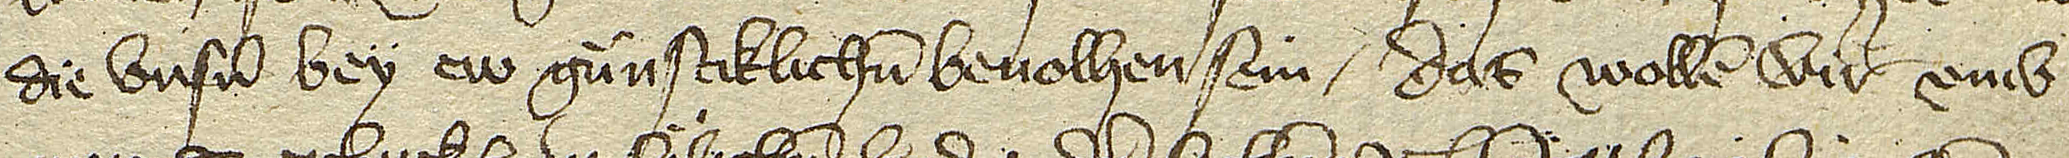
die vnſn* bey ew günſtiklichn* beuolhen ſein / Das wolle* wir vmb
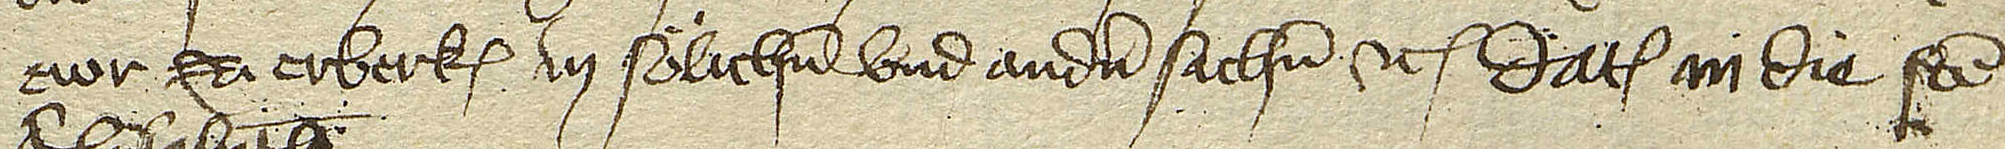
ewr %% erberk* in ſölichn* vnd andn* ſachn* ec* Dat* in die ſce*
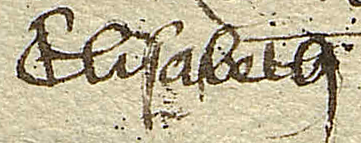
Eliſabeth*
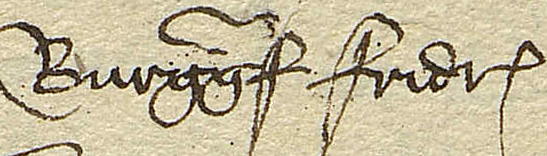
Burgg*f Fridr*
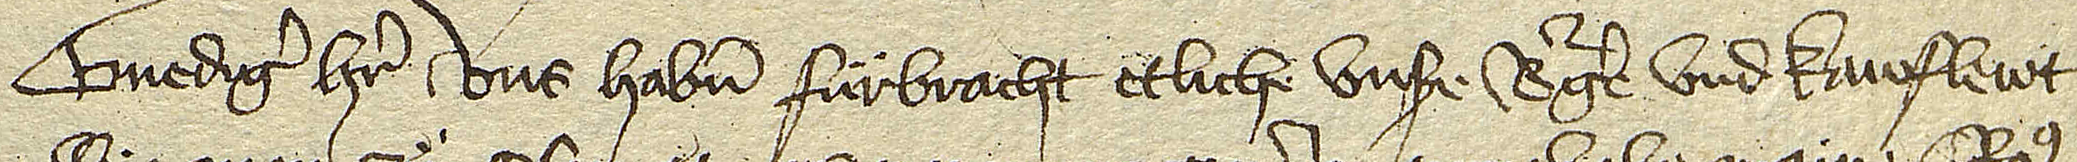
Gnedig* hr* / Vns habn* fürbracht etliche vnſ*e B*g*e vnd kawflewt
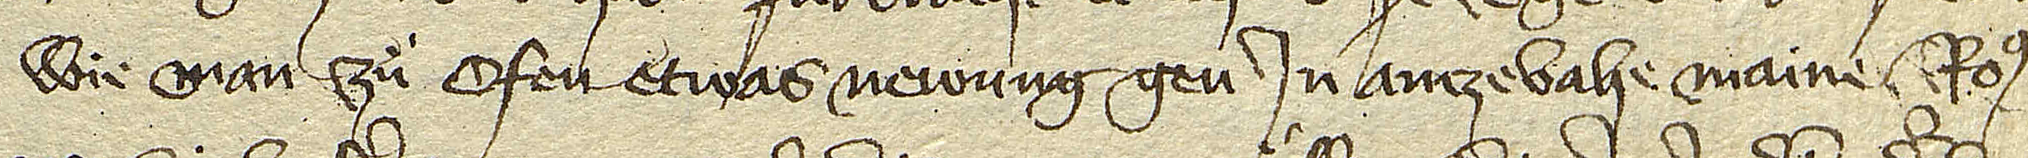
wie man cʒü Ofen etwas newung gen In ancʒevahe maine / Ro*
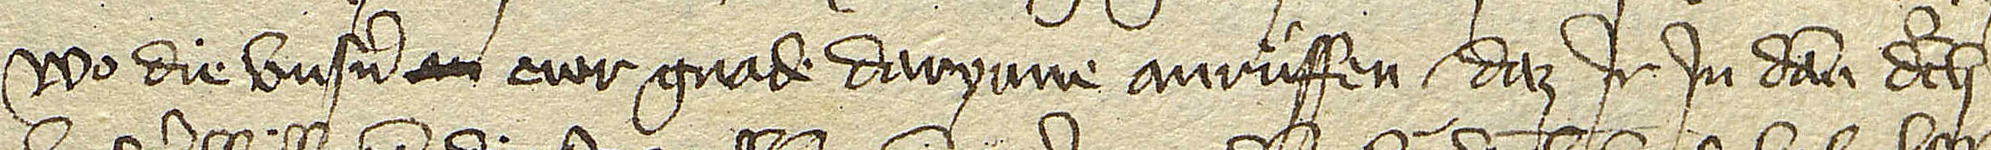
wo die vnſn* an ewr gnad darynne anrüffen / daʒ Ir In dan* d*ch
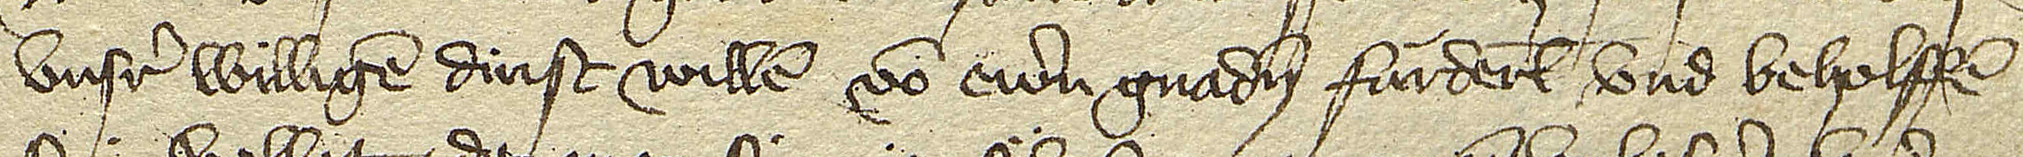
vnſr* willige* dinſt wille* vo* ew*n gnadn* fürderl* vnd beholffe*
